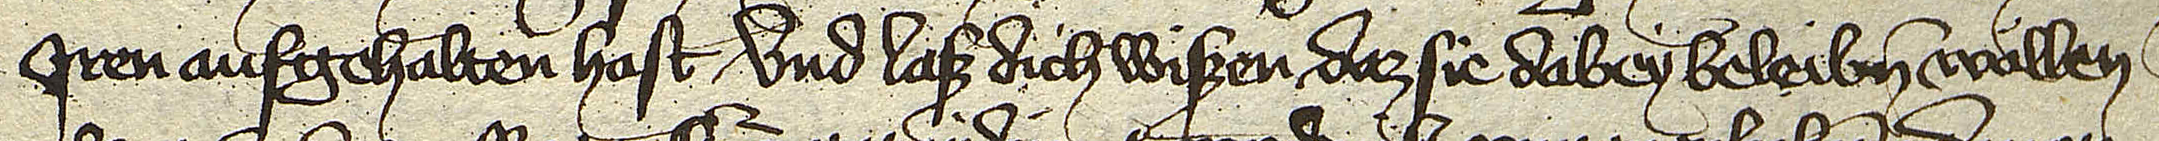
Iren aufgehalten haſt / vnd laſʒ dich wiſʒen / daʒ ſie dabey beleibn* wöllen
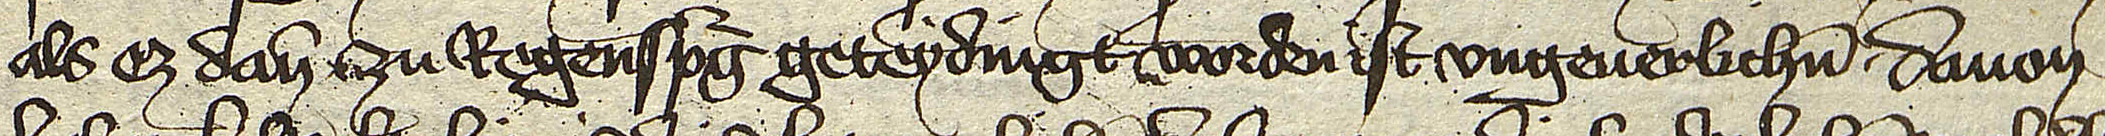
als eʒ dan* cʒu Regenſp*g geteydingt worden iſt vngeuerlichn* / Dauon
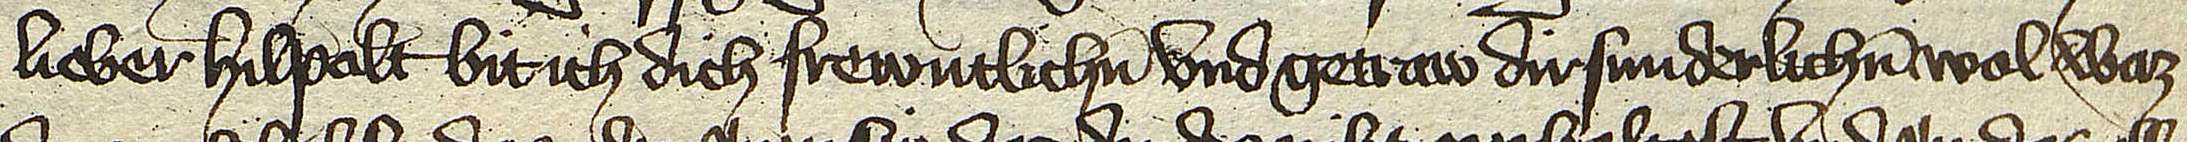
lieber hilpolt bit ich dich frewntlilchn* vnd getraw dir ſunderlichn* wol waʒ
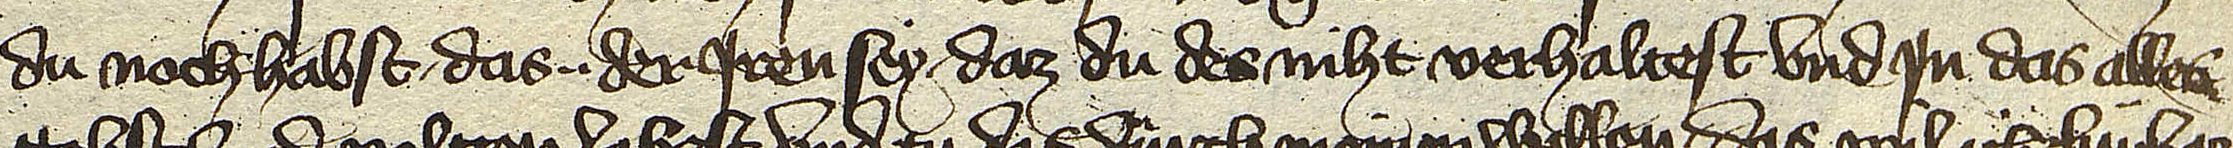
du noch habſt / das ~ der Iren ſey / daʒ du des niht verhalteſt vnd In das alles
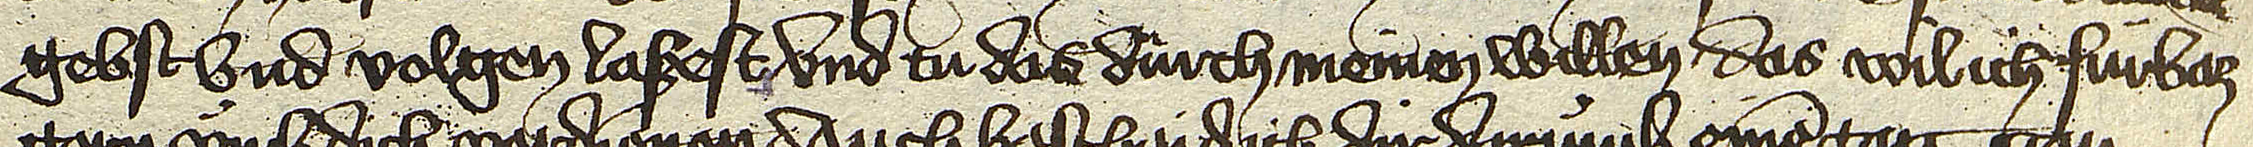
gebſt vnd volgen laſʒeſt / vnd tu das durch meinen willen / das wil ich fürbaʒ
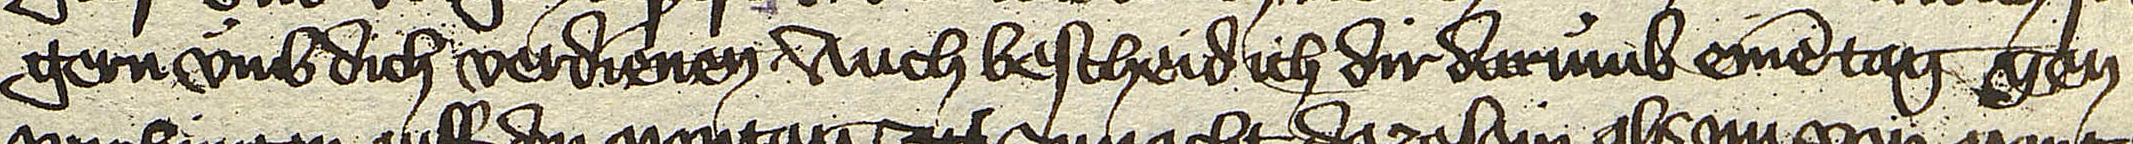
gern v̈mb dich verdienen / Auch beſcheid ich dir darümb eine* tag gen
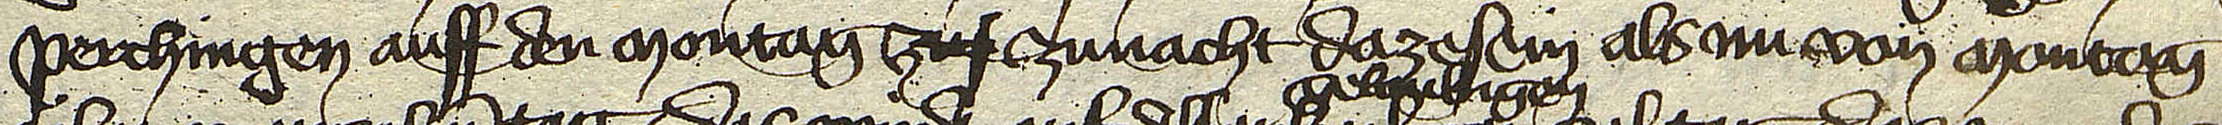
Perchingen auff den Montag cʒuſ cʒunacht daʒeſein als nu von Montag
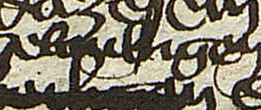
gelaubigen
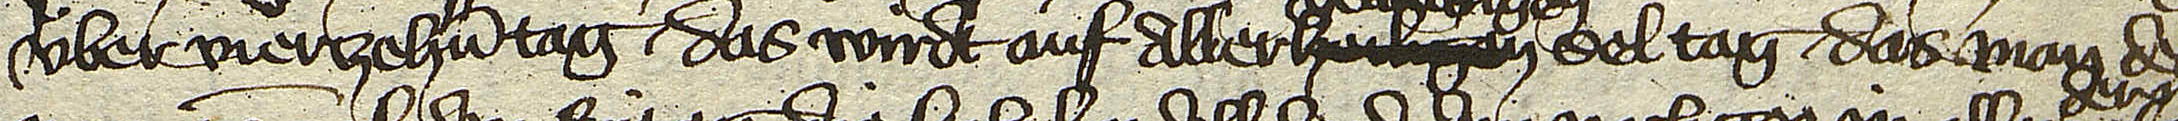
v̈ber viervʒehn* tag / das wirdt auf Aller heiligen Sel tag / das man das
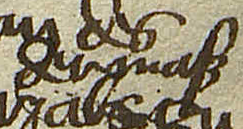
dermaſʒ
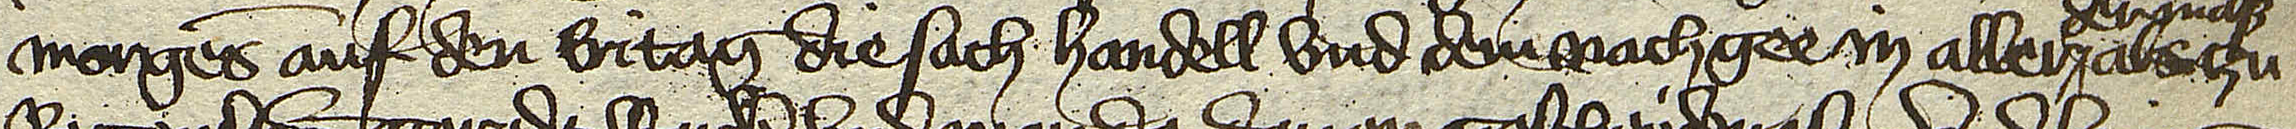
morges* auf den Eritag die ſach handell vnd dem nach gee in aller als cʒu
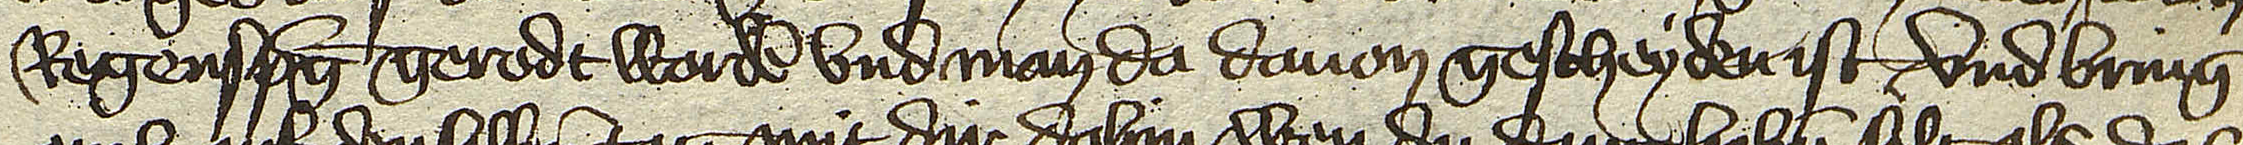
Regenſp*g geredt worde* vnd man da dauon geſcheyden iſt / vnd bring
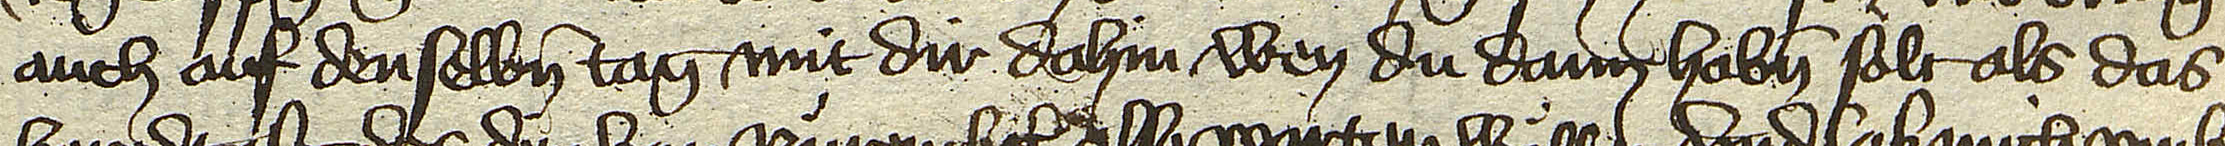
auch auf denſelbn* tag mit dir dahin / wen du dann habn* ſolt als das
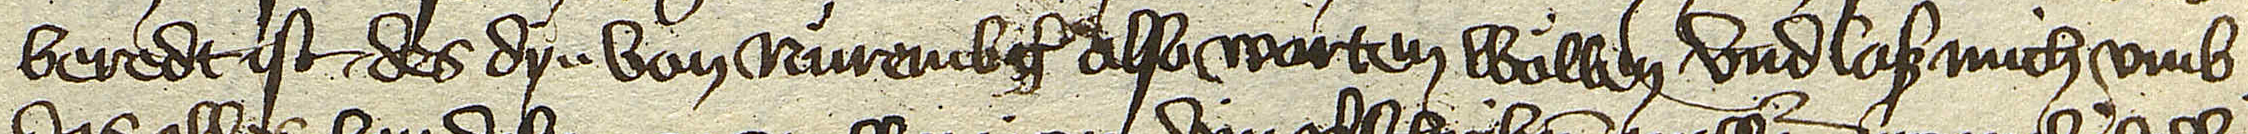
beredt iſt / des dy ~ von Nürembg* Alſo warten wöllen / vnd laſʒ mich vmb
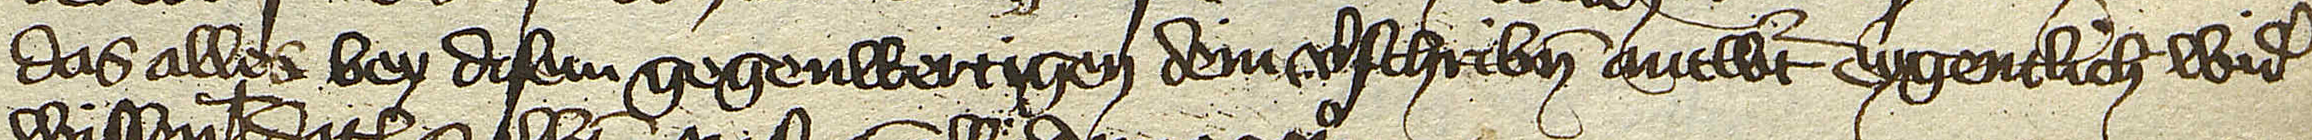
das alles bey diſem gegenwertigen dein v*ſchribn* antwt* eygentlich wid*
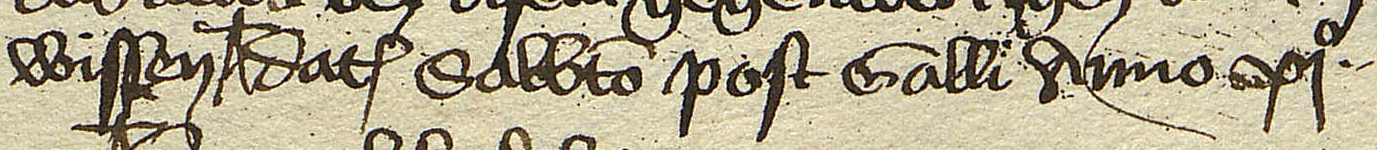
wiſſen / Dat* Sabbto* poſt Galli Anno xi* .
